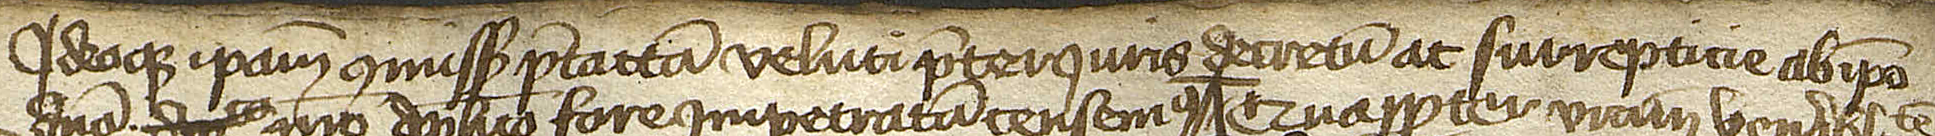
Ideoq* ip*am *miſſ* p*tacta* veluti p*ter Iuris decretu* ac ſurrepticie ab ip*o
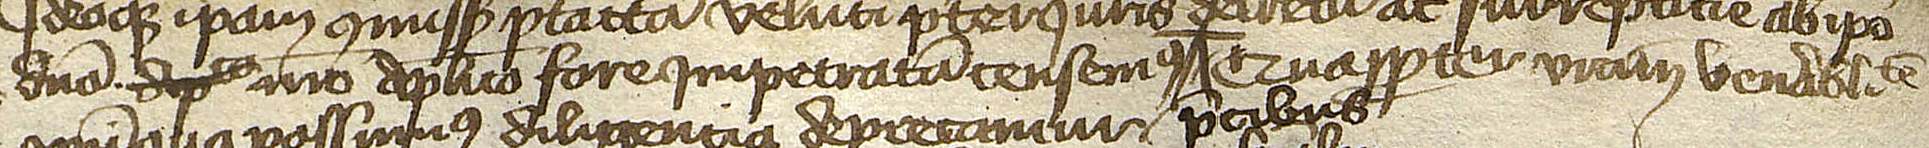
d*no . Ap* n*ro Ap*lico fore Impetrata* cenſem* / Quap*pter v*ram ven*ab*l*te*
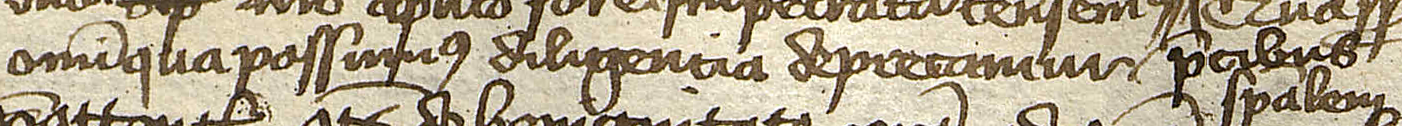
om*i qua poſſum* diligencia deprecamur / p*cibus
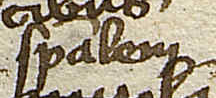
ſpalem*
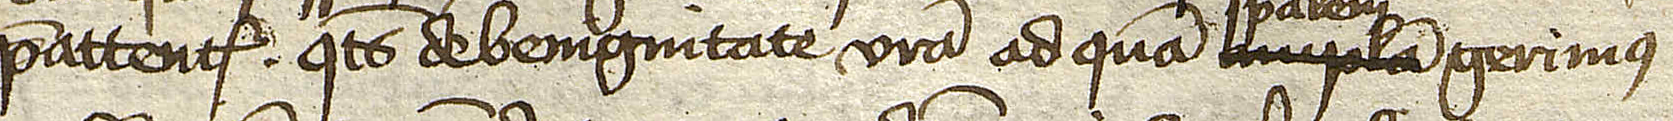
p*attentis . q*t*s de benignitate v*a ad qua* a%%pla* gerim*
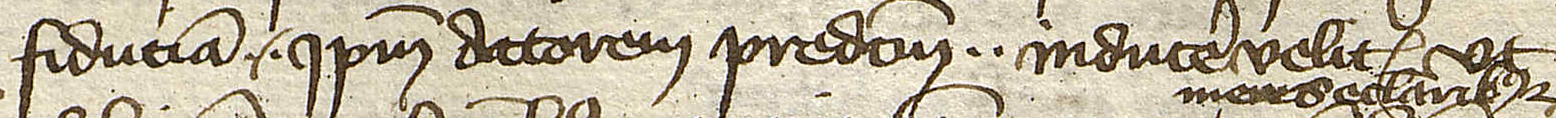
fiducia* . / . Ip*m Actorem pred*c*m ~ induce* velit* vt
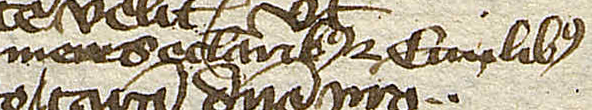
mens Sec*larib* @ Ciuilib*
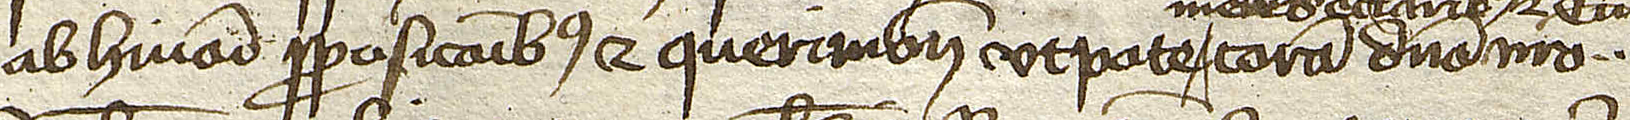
ab hui*m*d* p*poſic*o*ib* @ querimon* vt pote cora* d*no n*ro . .
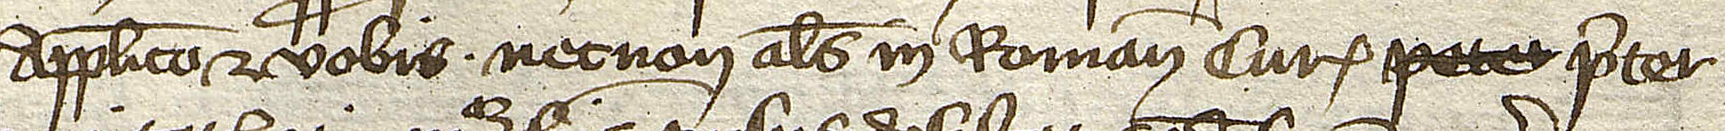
App*lico @ vobis . necnon al*s in Roman* Cur* peter p*ter
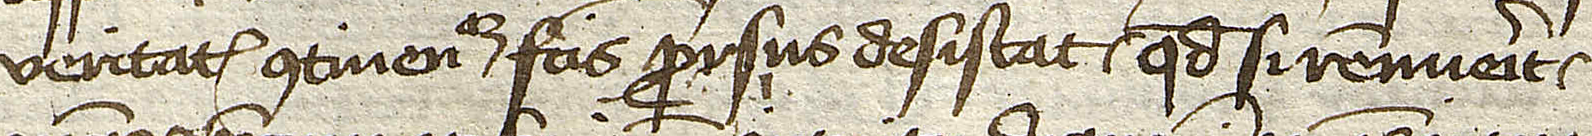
veritat* *tinent* f*c*is p*rſus deſiſtat / q*d ſi renue*it /
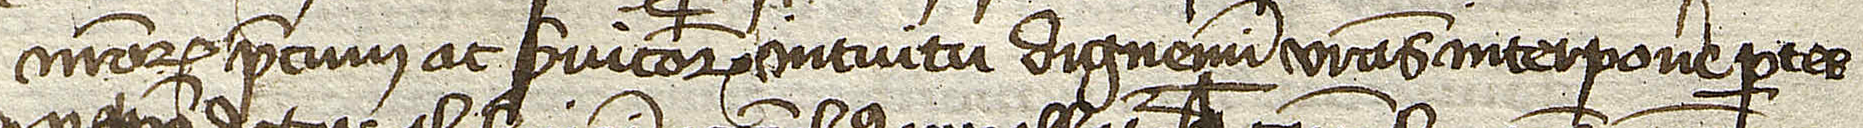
n*ror* p*cum ac ſ*uitor* intuitu dignemi* v*ras interpon*e p*ces
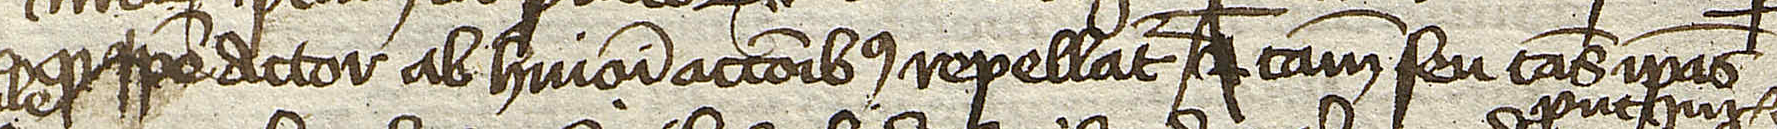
q* Ip*e Actor ab hui*odi act*o*ib* repellat* c*am ſeu ca*s ip*as
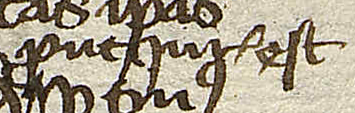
p*ut Iur* eſt
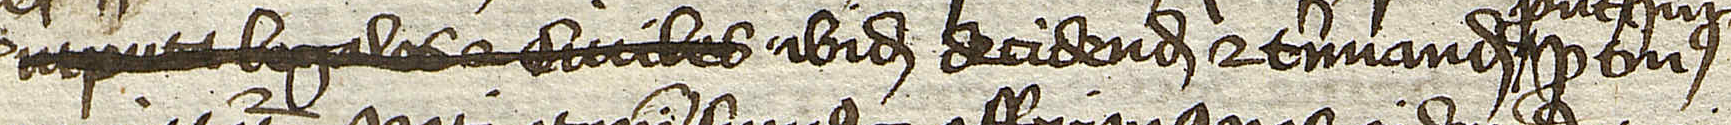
utp%%% begalos @Ciuibes / ibid* decidend* @ t*nuand* p*tin*
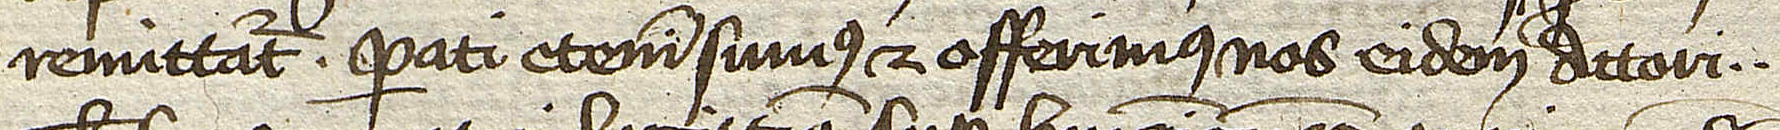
remittat* . P*ati ete*ni ſum* @ offerim* nos eidem Actori . .
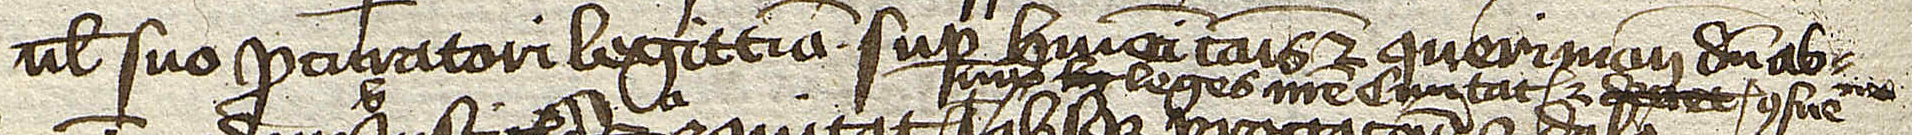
u*l ſuo p*curatori legitti*o ſup* hui*o*i ca*is @ querimon* d*n* ab =
